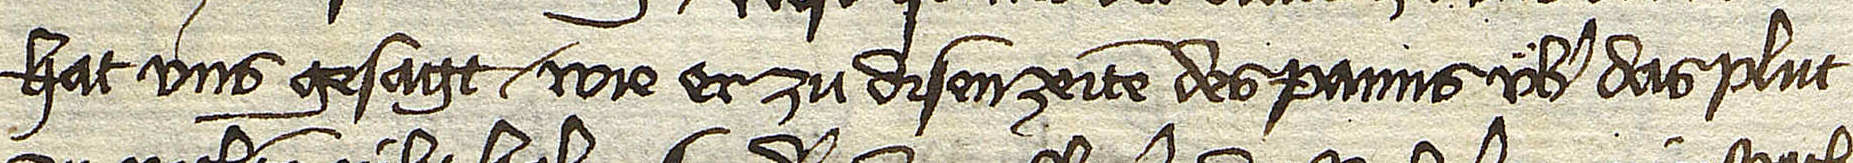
hat vns geſagt / wie er ʒu diſen ʒeite* des Panns v̈b* das plut
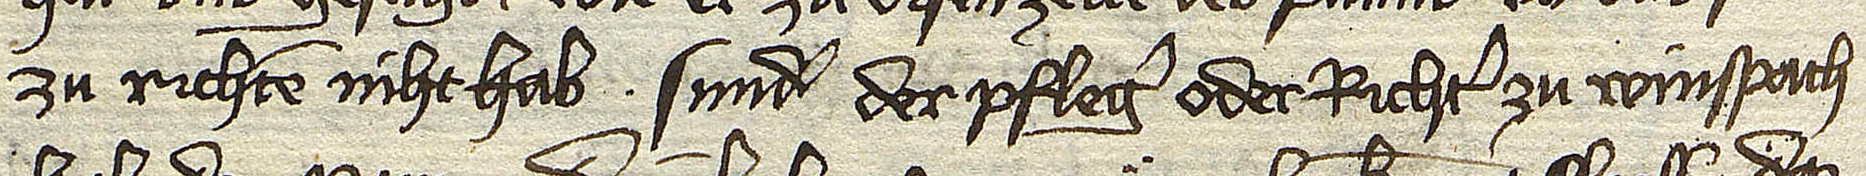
ʒu richte* niht hab . ſund* der pfleg* oder Richt* ʒu winſpach
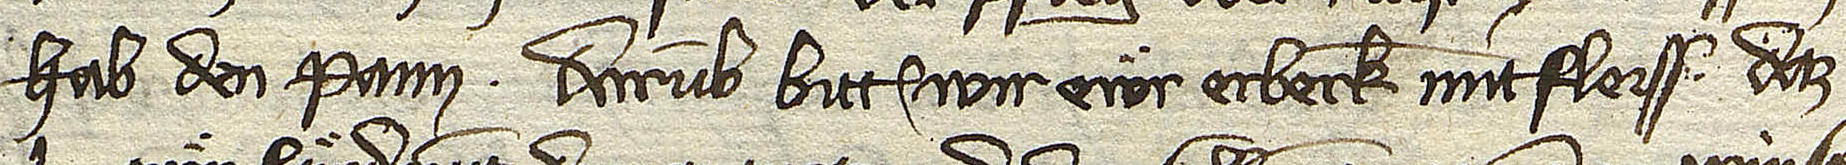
hab den Pann . Daru*b bitt* wir ewr erberk* mit fleiſſ . daʒ
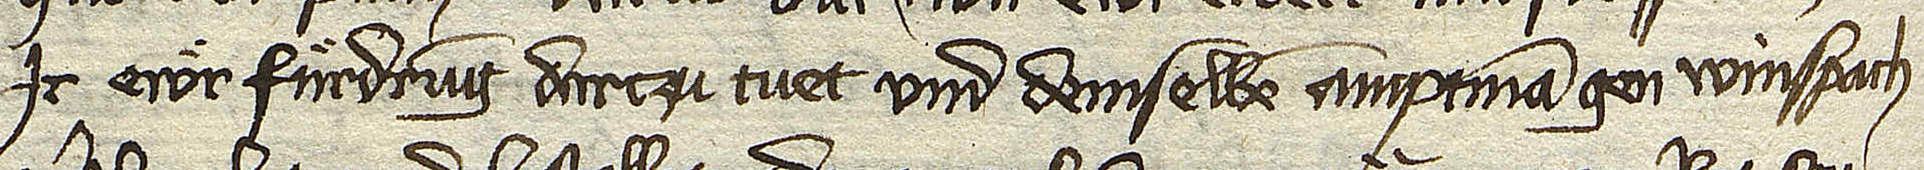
Ir ewr fürdru*g darcʒu tuet vnd demſelbe* amptma* gen winſpach
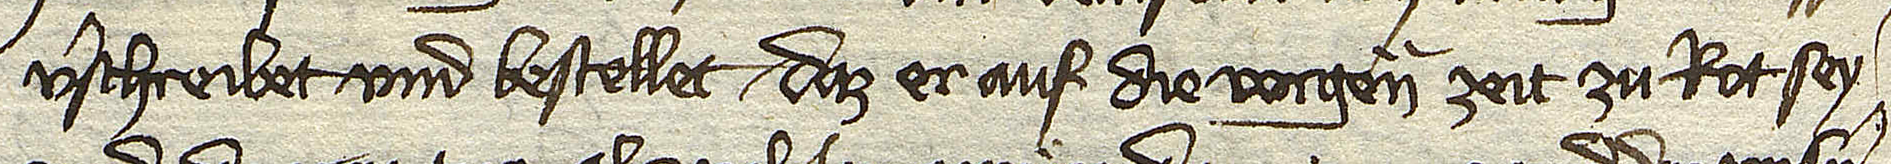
v*ſchreibet vnd beſtellet / daʒ er auf die vorgen* ʒeit ʒu Rot ſey
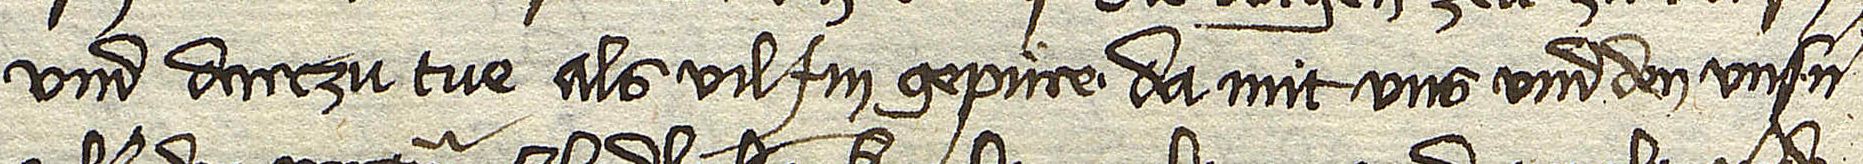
vnd darcʒu tue als vil Im gepüre . da mit vns vnd den vnſ*n
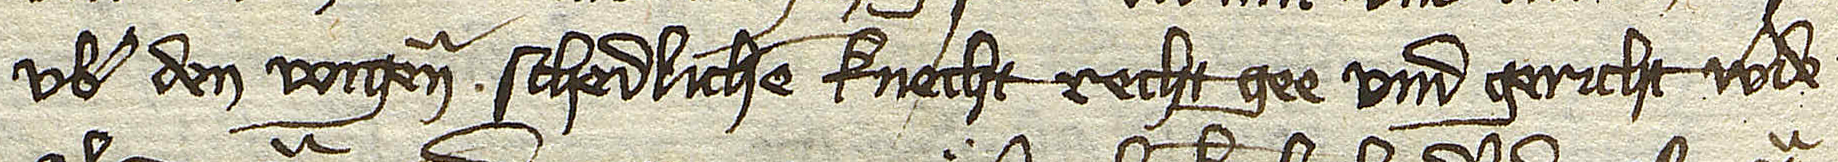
vb* den vorgen* . ſchedliche* knecht recht gee vnd gericht w*de
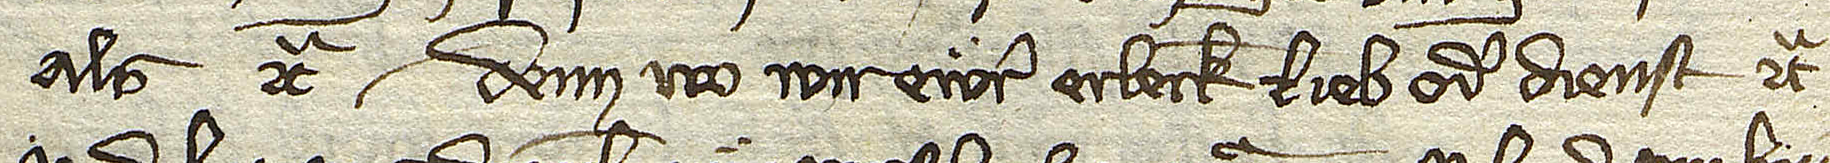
als ec* / Denn wo wir ew*r erberk* lieb od* dienſt ec*
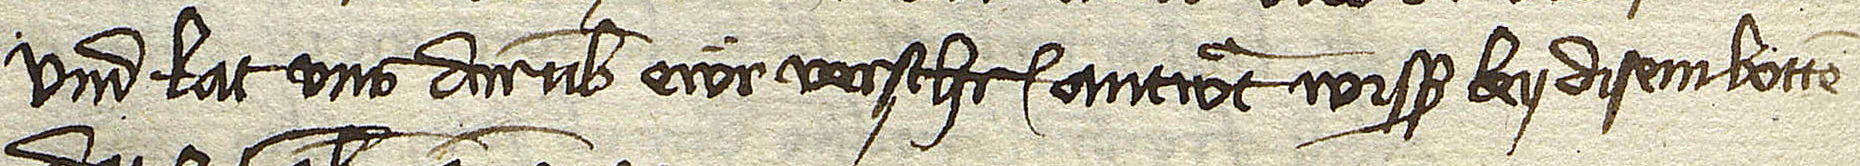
vnd lat vns daru*b ewr verſchr* antw*t wiſſ* bey diſem botte*
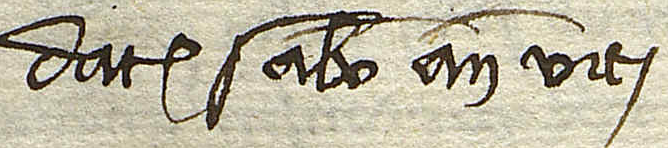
dat* ſabo* an* viti
